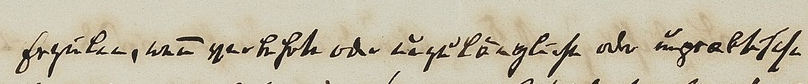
Erzielen, wenn verkehrte oder unzulängliche oder unpraktische
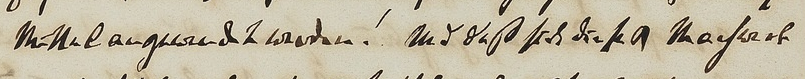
Mittel angewendet werden! Und daß sich dieses Machwerk
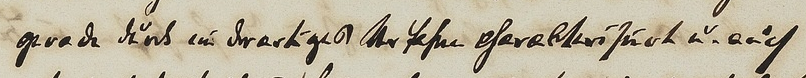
gerade durch ein derartiges Verfahren charakterisiert u. auch
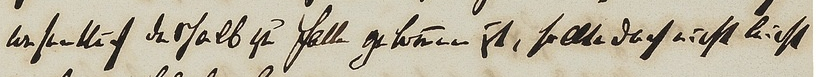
wesentlich deshalb zu Falle gekommen ist, sollte doch nicht leicht
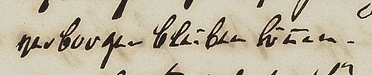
verborgen bleiben können.
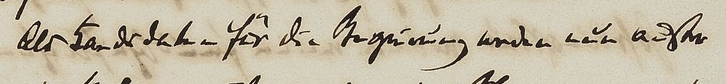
Als Kandidaten für die Regierung werden nun außer
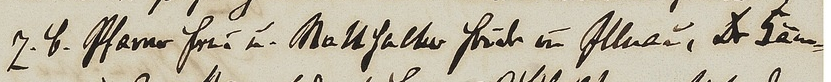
z. b. Pfarrer Frei u. Statthalter Frick in Illnau, Dr. Käm-
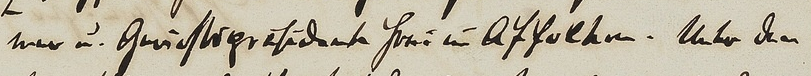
mer u. Gerichtspräsident Frei in Affoltern. Unter den
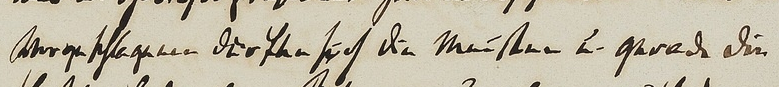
Vorgeschlagenen dürften sich die Meisten u. gerade die
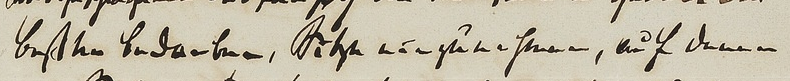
beßten bedanken, Sitze einzunehmen, auf denen
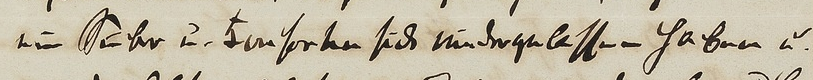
ein Sieber u. Konsorten sich niedergelassen haben u.
